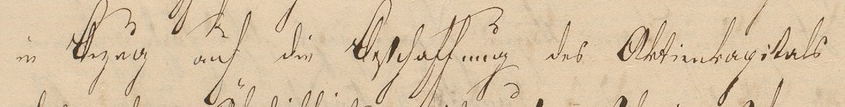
in Bezug auf die Beschaffung des Aktienkapitals
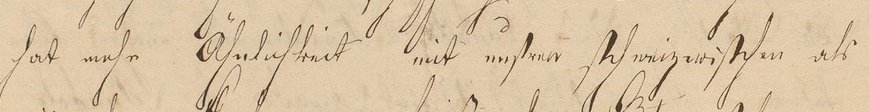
hat mehr Ähnlichkeit mit unsrer schweizerischen als
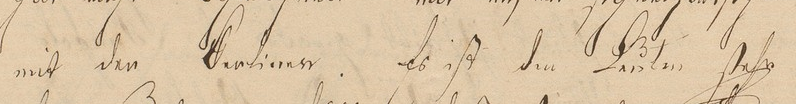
mit der Berliner. Es ist den Leuten sehr
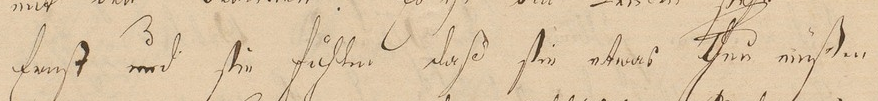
Ernst und sie fühlen daß sie etwas thun müßen.
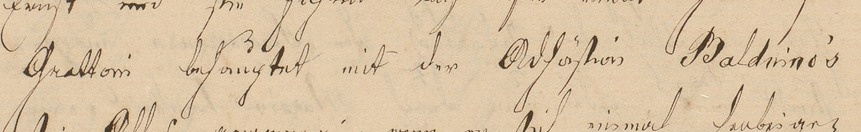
Grattoni behauptet mit der Adhäsion Balduino's
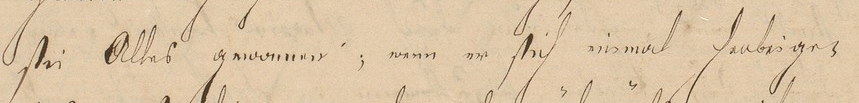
sei Alles gewonnen; wenn er sich einmal herbeige-
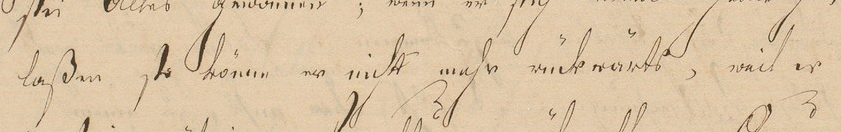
laßen so könne er nicht mehr rückwärts, weil er
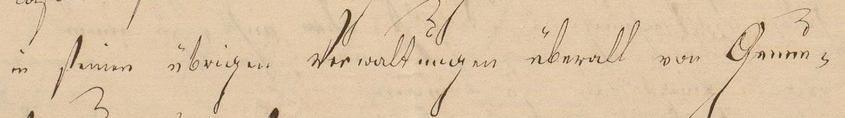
in seinen übrigen Verwaltungen überall von Genue-
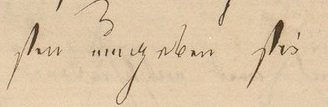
sen umgeben sei.
